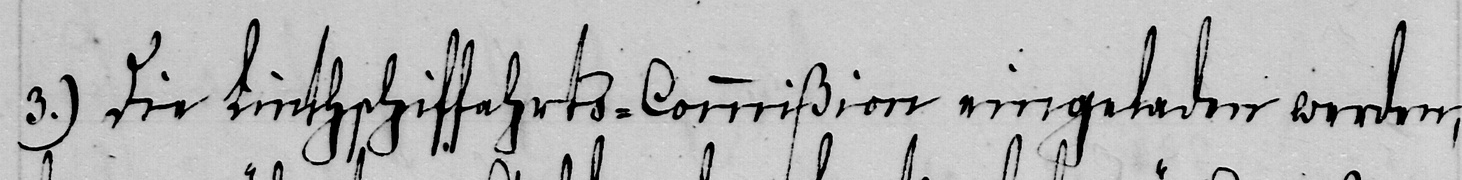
3.) Die Linthschiffahrts-Commißion eingeladen werden,
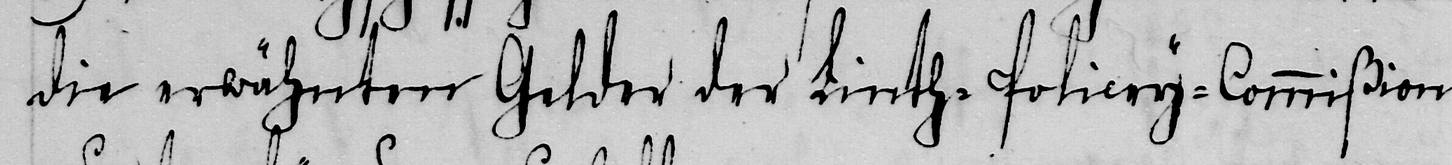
die erwähnten Gelder der Linth-Policey-Commißion
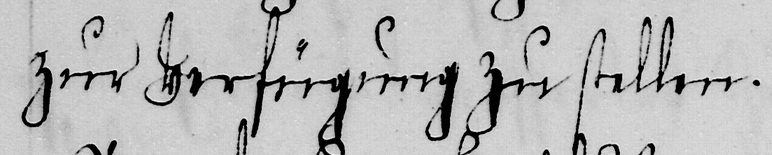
zur Verfügung zu stellen.
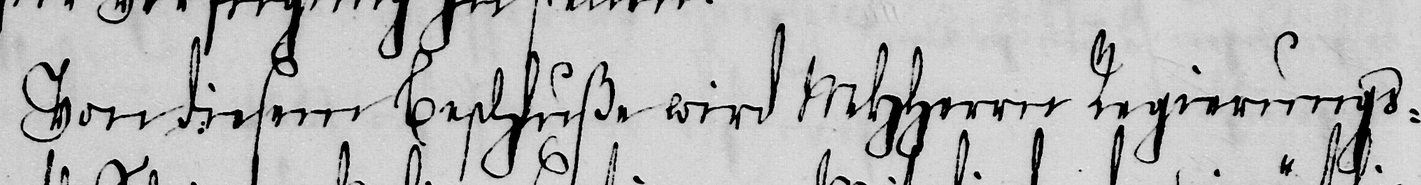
Von diesem Beschluße wird MHHerrn Regierungs¬
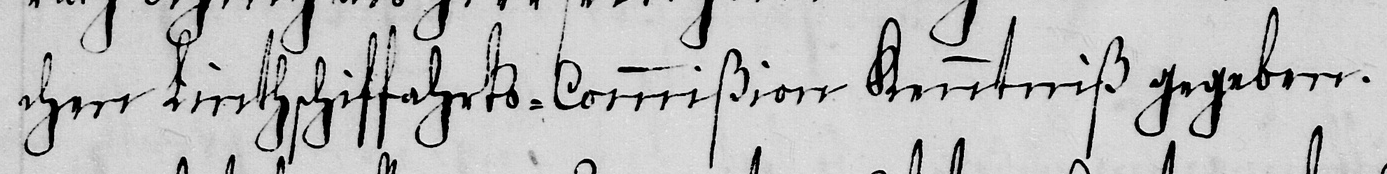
chen Linthschiffahrts-Commißion Kenntniß gegeben.
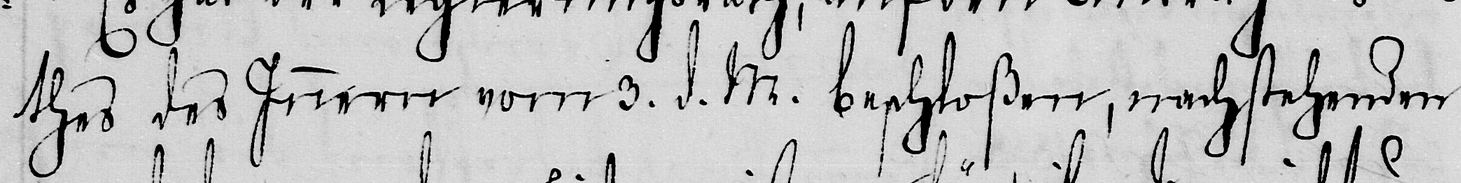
thes des Innern vom 3. d. M. beschloßen, nachstehenden
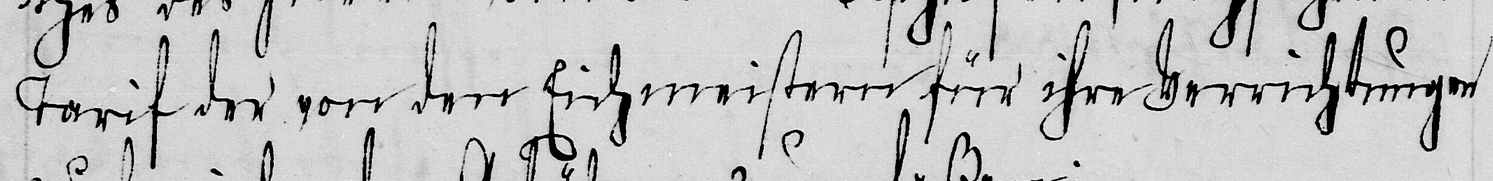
Tarif der von den Eichmeistern für ihre Verrichtungen
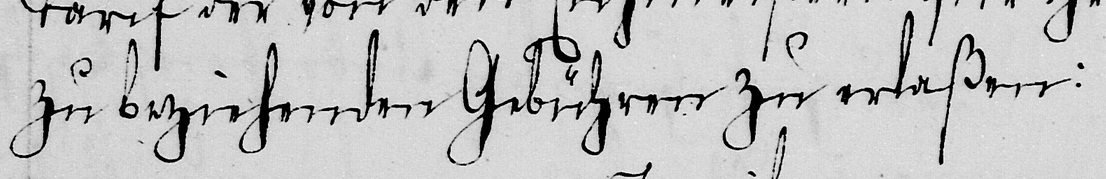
zu beziehenden Gebühren zu erlaßen:
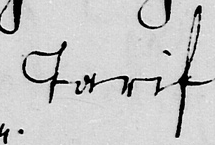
Tarif
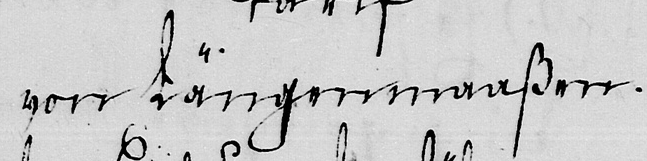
von Längenmaaßen.
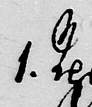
rtli¬
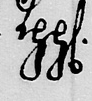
1.
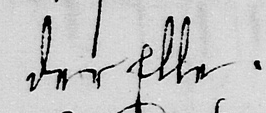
der Elle
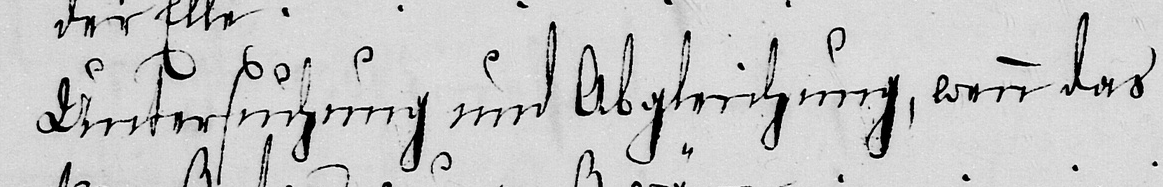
Untersuchung und Abgleichung, wenn das
